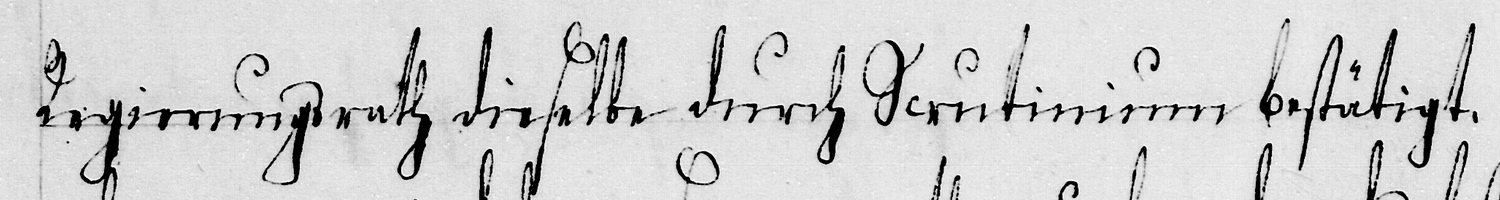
Regierungsrath dieselbe durch Scrutinium bestätigt.
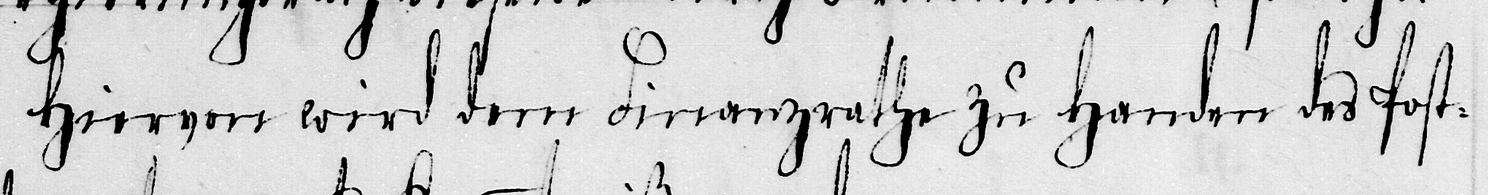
Hiervon wird dem Finanzrathe zu Handen des Post¬
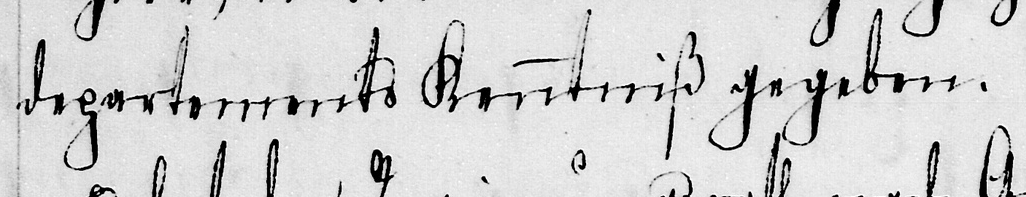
departements Kenntniß gegeben.
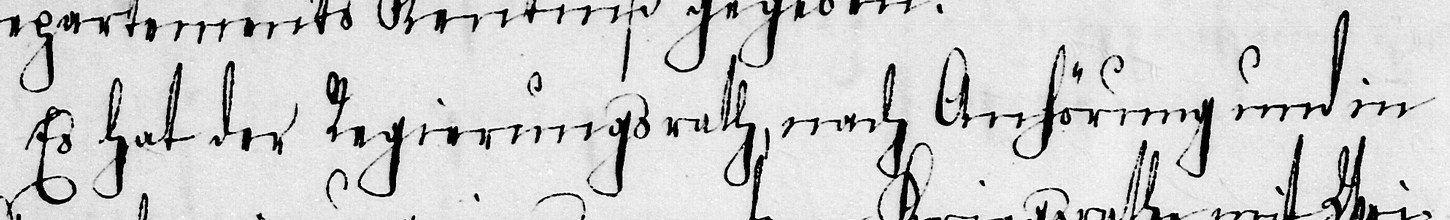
Es hat der Regierungsrath, nach Anhörung und in
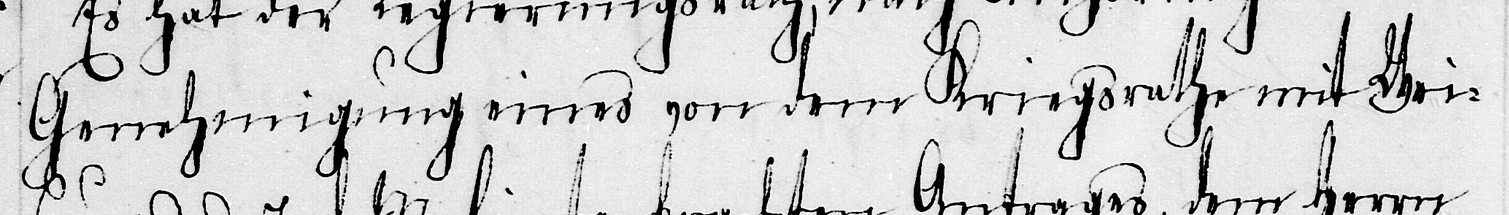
Genehmigung eines von dem Kriegsrathe mit Wei¬
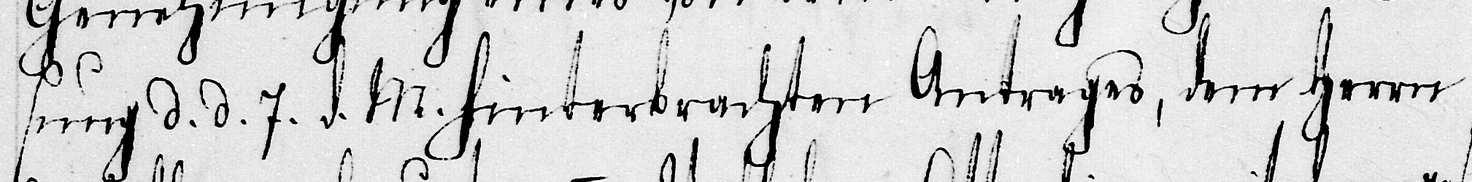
sung d. d. 7. d. M. hinterbrachten Antrages, dem Herrn
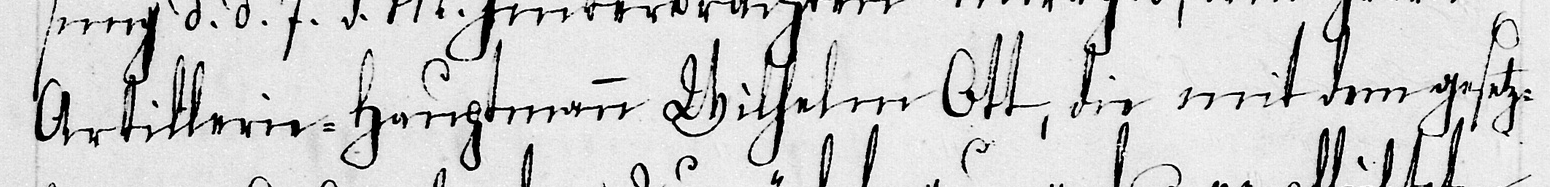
Artillerie-Hauptmann Wilhelm Ott, die mit dem gesetz¬
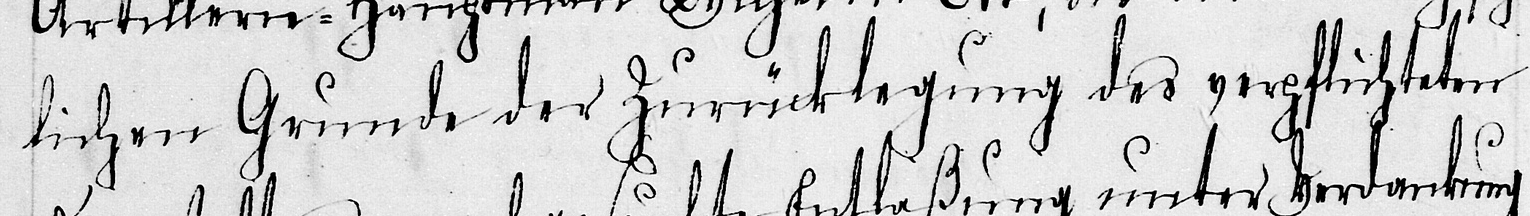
lichen Grunde der Zurücklegung des verpflichteten
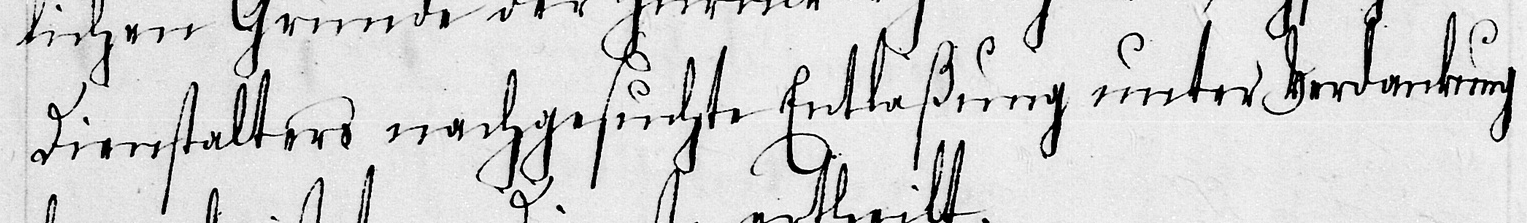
Dienstalters nachgesuchte Entlaßung unter Verdankung
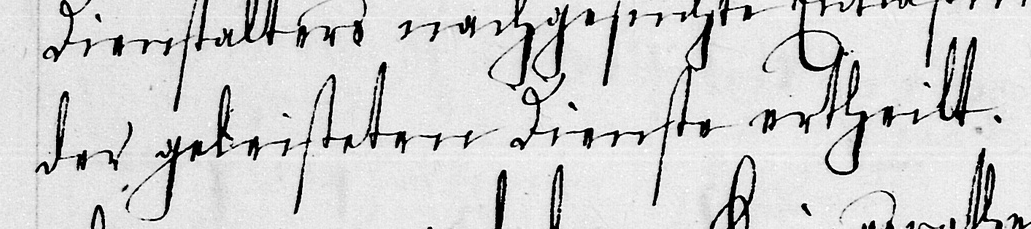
der geleisteten Dienste ertheilt.
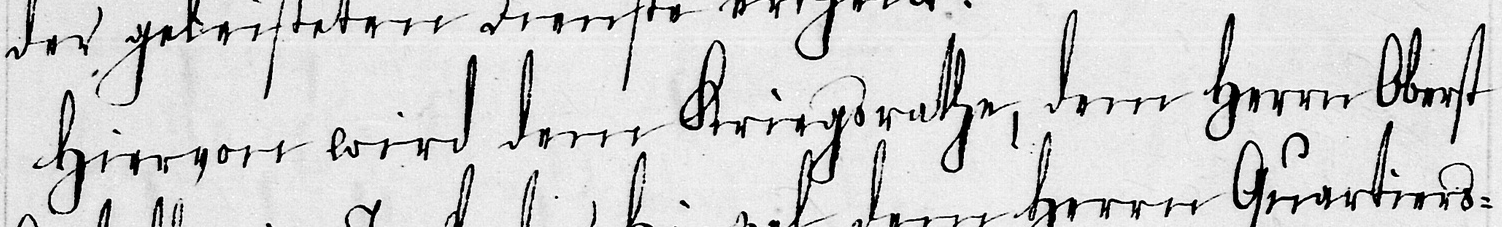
Hiervon wird dem Kriegsrathe, dem Herrn Oberst
